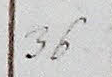36
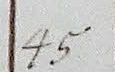45
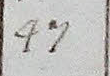47
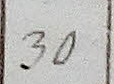30
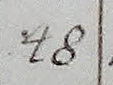48
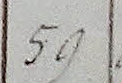59
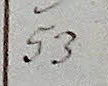53
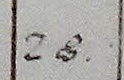28
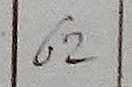62
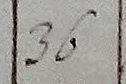36
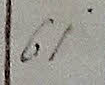61
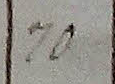70
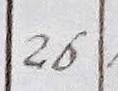26
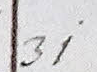31
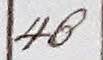46
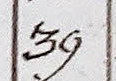39
